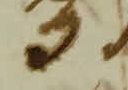3
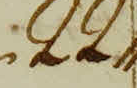22
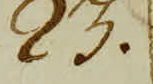23.
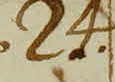24.
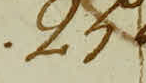25
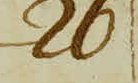26
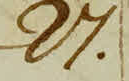27.
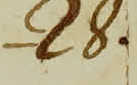28
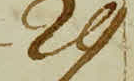29
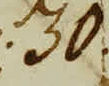30
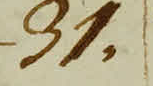31.
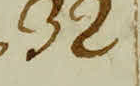32
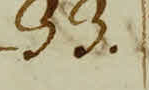33.
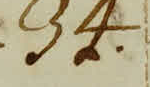34.
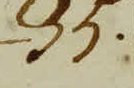35
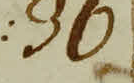36
